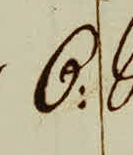6:
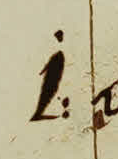1:
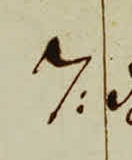7:
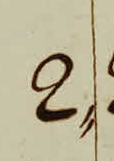2
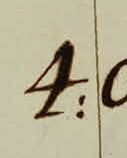4:
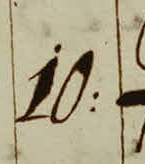10:
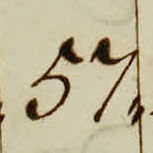57
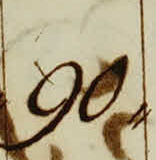90
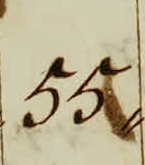55
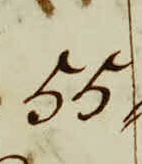55
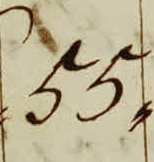55
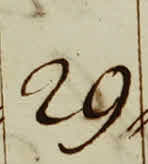29
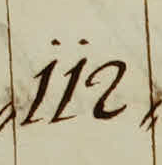112
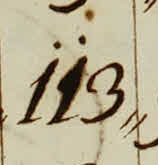113
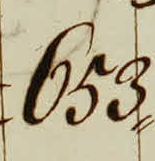653
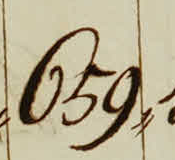659
